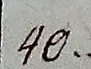40
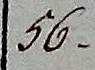56
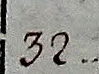32
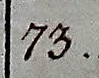73
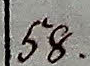58
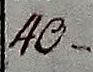40
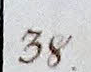38
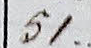51
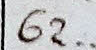62
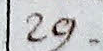29
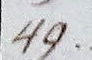49
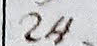24
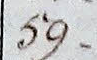59
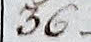36
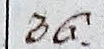36
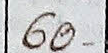60
